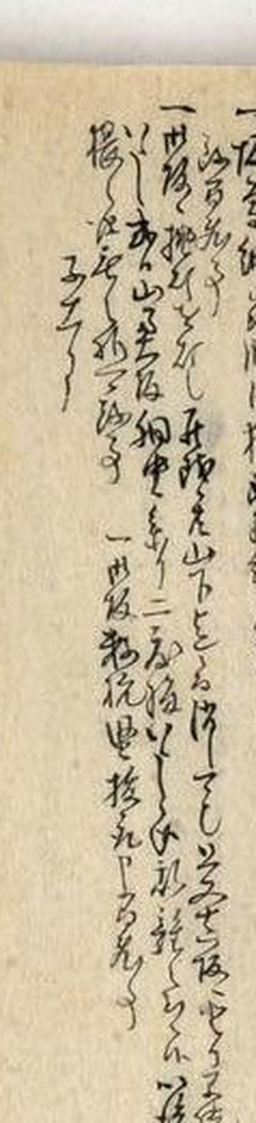猥之儀無之様可致事一御坂数杭堅抜取申間敷事
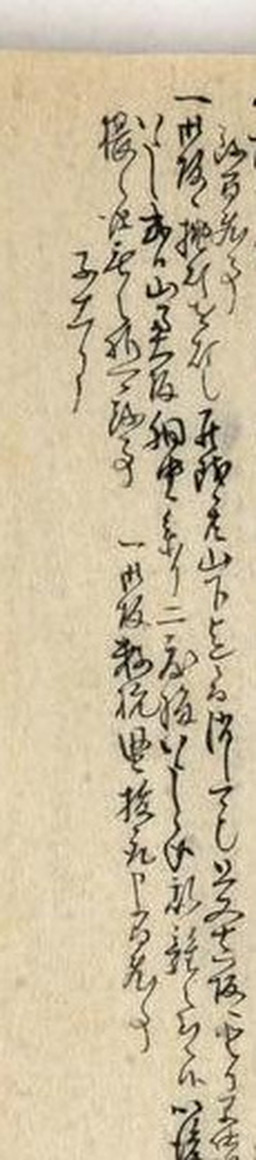猥之儀無之様可致事一御坂数杭堅抜取申間敷事
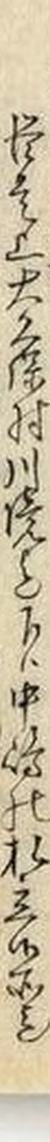従是上大久保村川境迄下ハ中嶋の札立候所迄
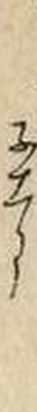子十一月
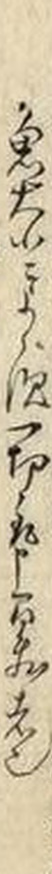魚大小ニよらす一切取申間敷者也
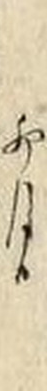卯月日
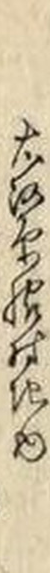右河原脇村地内
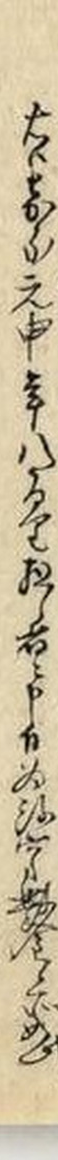右ハ嘉永元申年八百里組之者ニ申付為致穿鑿候所如此

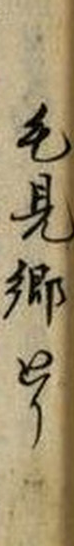毛見郷廻り
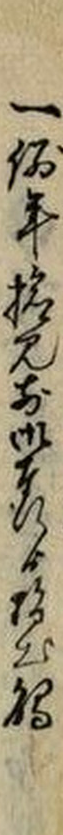一例年検見前御奉行ゟ指出触
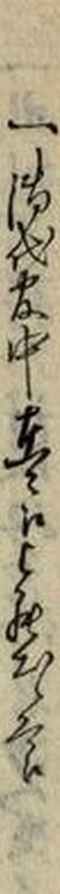一御代官中在々江被罷出候節
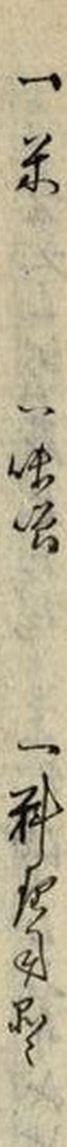一米一味噌一料理用品々
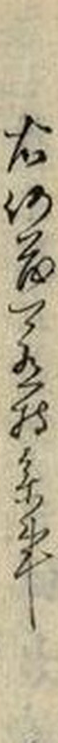右何茂可有持参事
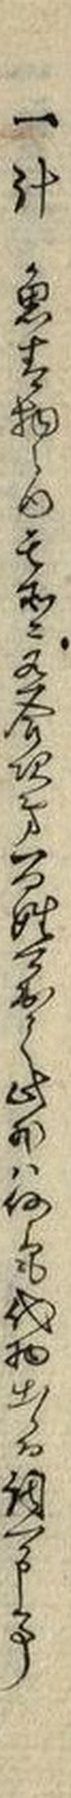一汁魚青物之内其所ニ有合次第百姓可出之此外ハ何而も代物出候而調可申事
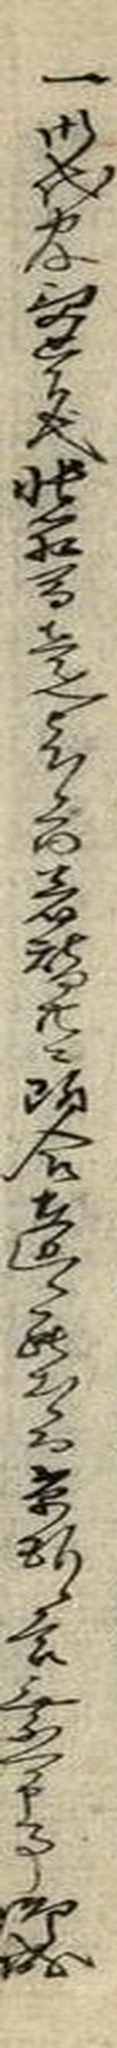一御代官受込下代帳箱馬壱疋被下候間着替共ニ附合在廻へ罷出候而草臥候節乗可申事御城
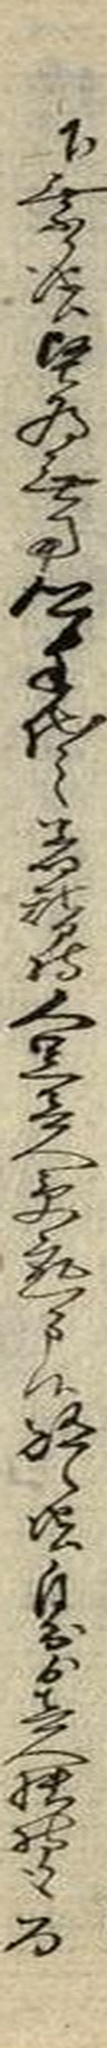下乗候儀ハ堅為無用郷手代之着替持人足壱人受取可申候賄之儀ハ自分ゟ壱人扶持ツヽ百
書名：御国他国諸事之部
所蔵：福井県文書館 Fukui Prefectural Archives
